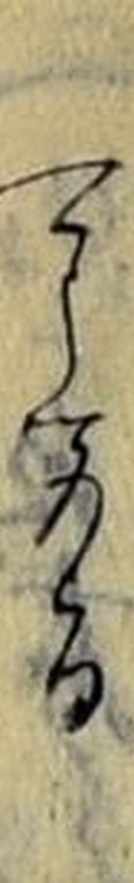可申聞旨
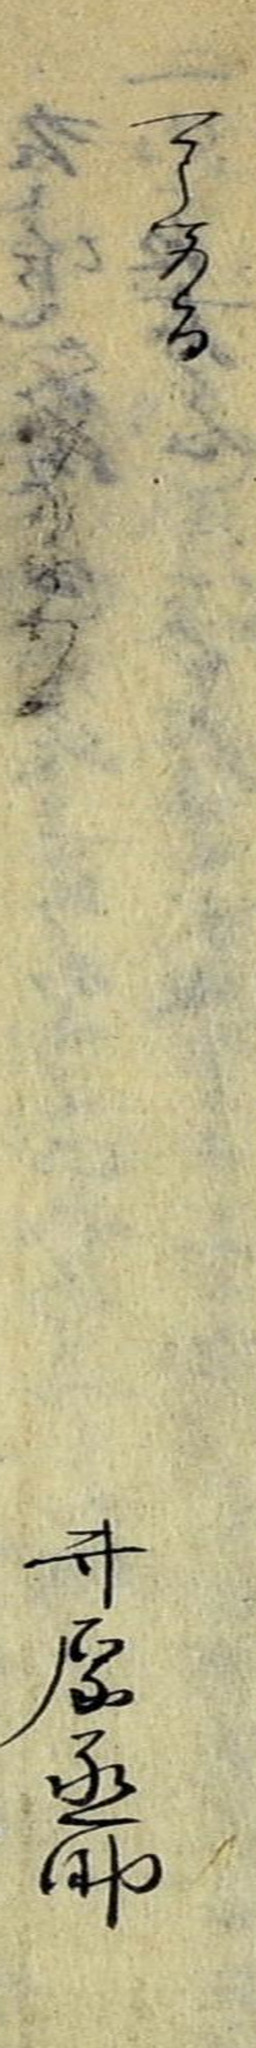井原丞助
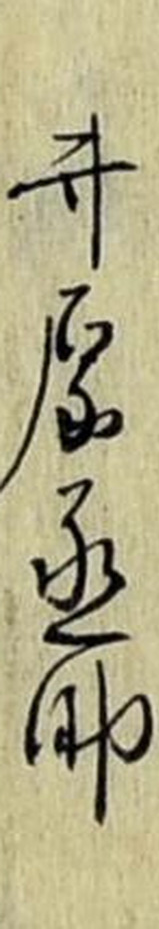井原丞助
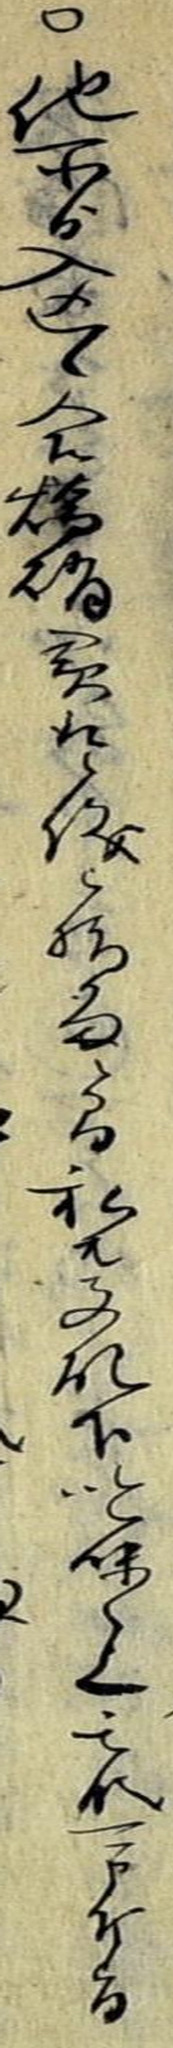〇他所ゟ入込候合焔硝買取候儀被指留候間私共支配下吟味之上其段可申付旨
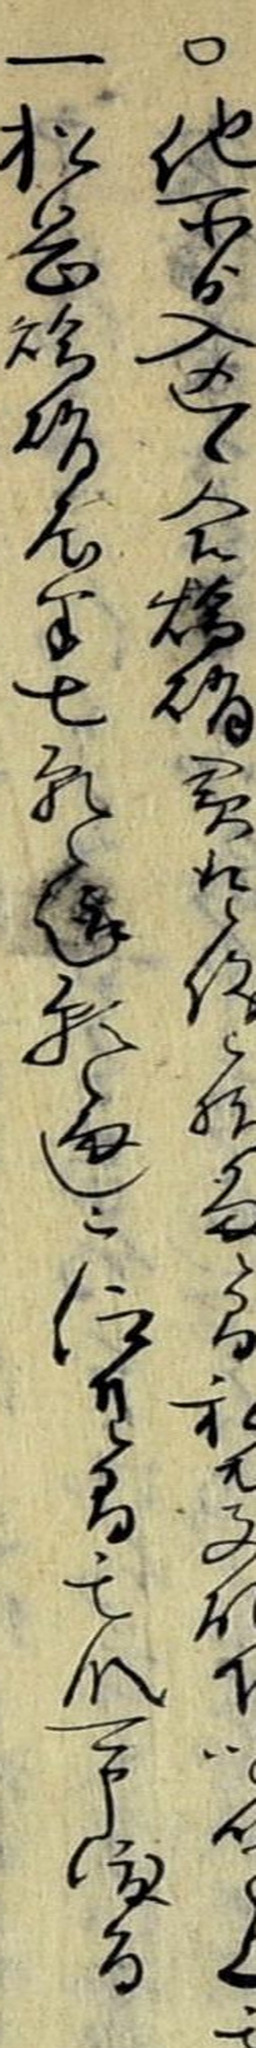一松岡焔硝屋半七願之趣願之通被仰付候間其段可申渡旨
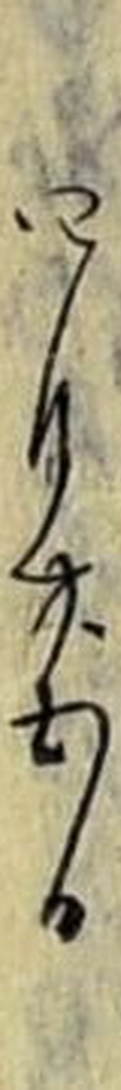四月廿五日
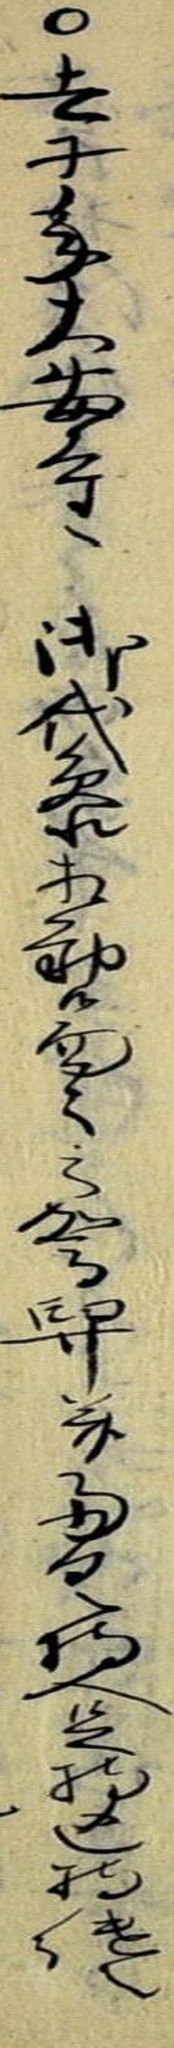〇去寅年大安寺へ御代参相勤候面々之駕舁并雨具持人足持込持継之
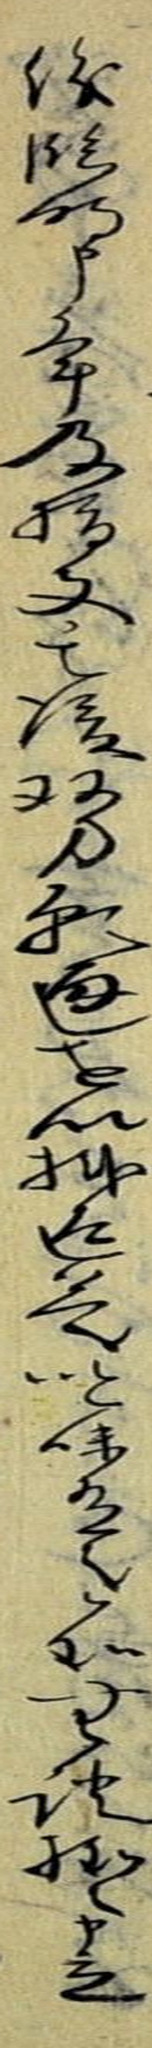儀臨時申争及指支其後双方願通を以掛返答吟味有之候処無証拠之申立
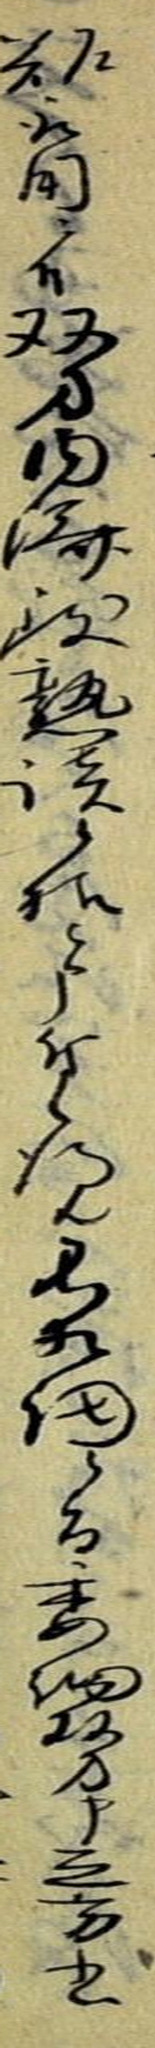難取用ニ付双方内済致熟談候様被申付候得共不相調候旨委細双方申立方書
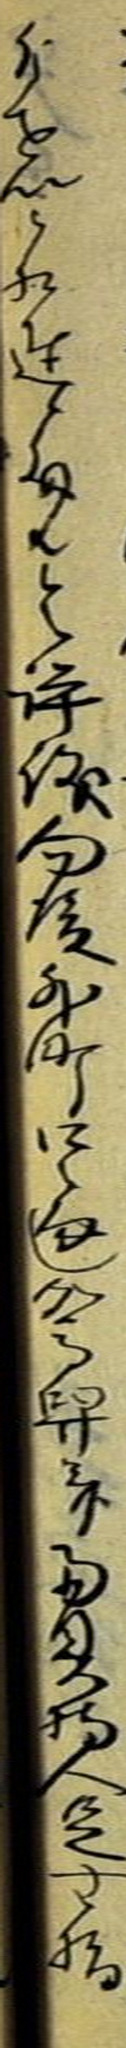付を以被相達候義共令評議向後外町口之通駕舁并雨具持人足無指
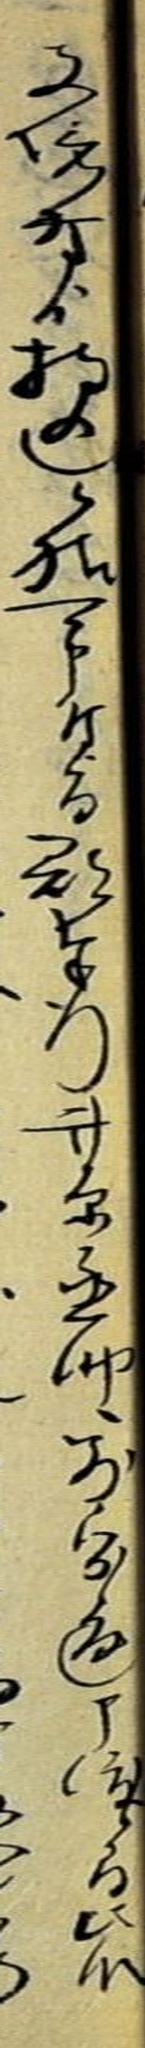支境村ゟ持込候様可申付旨郡奉行井原丞助へ別紙之通申渡候間此段
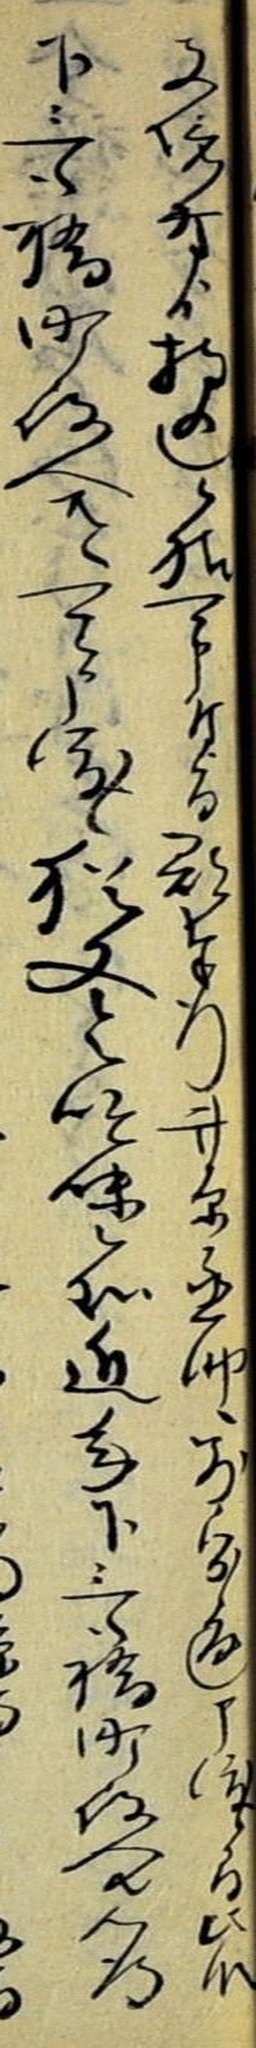下三ツ橋町役人共へ可被申渡候猶又令吟味候処近年下三ツ橋町役人共心得
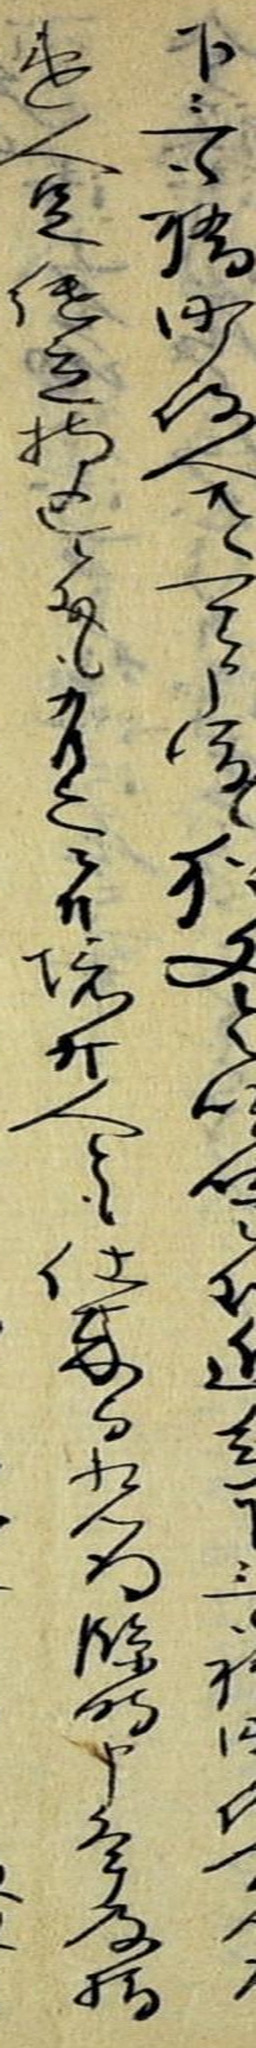違人足継立持込候義も有之ニ付境村人ニも仕来与相心得臨時申争及指
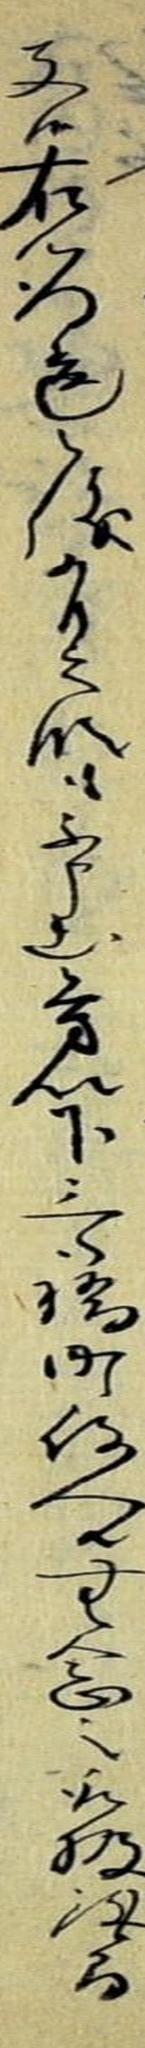支候右心得違之儀有之段も不申出旁以下三ツ橋町役人共無念之取扱致候間
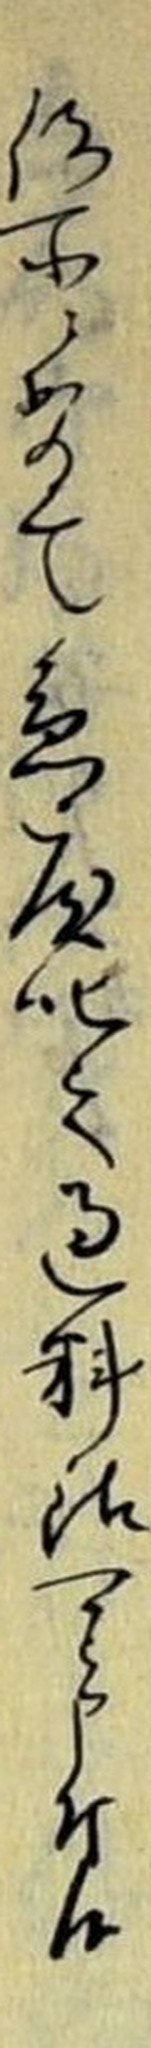役所ニおゐて急度叱之過料銀可被申付候
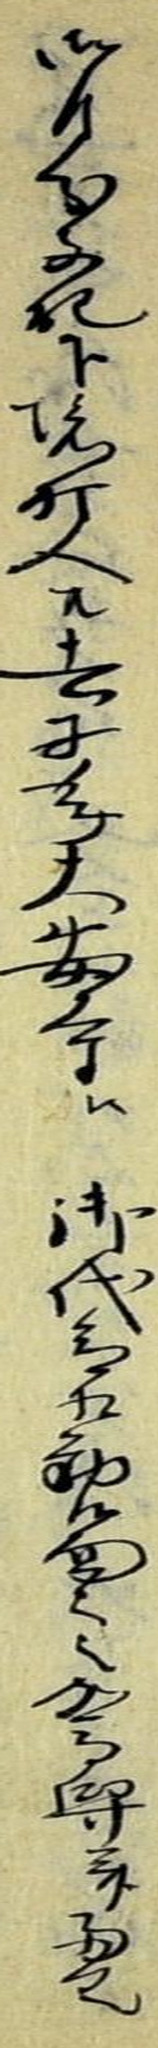御自分支配下境村人共去寅年大安寺江御代参相勤候面々之駕舁并雨具
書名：命令之部 三
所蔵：福井県文書館 Fukui Prefectural Archives
